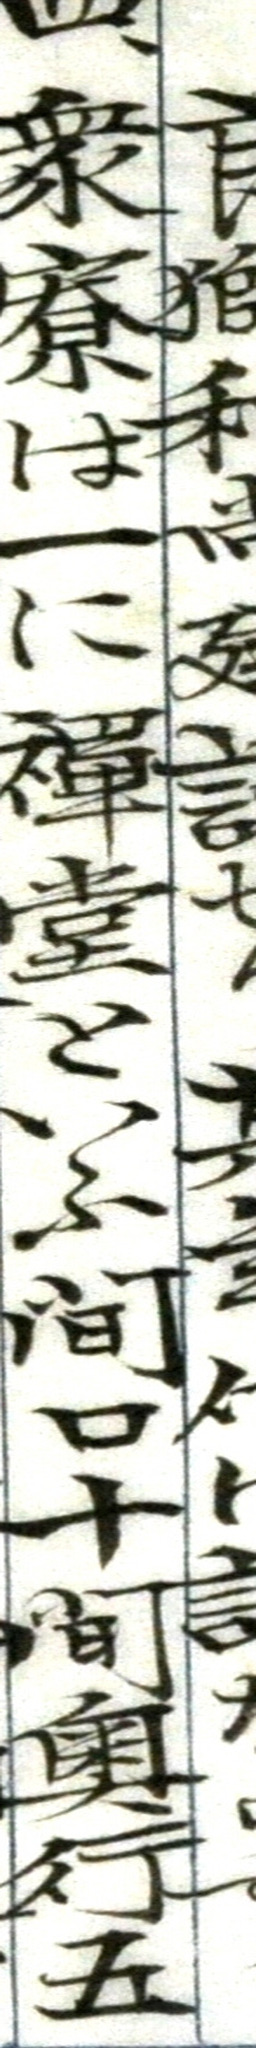四、衆寮は一に禅堂といふ間口十間奥行五
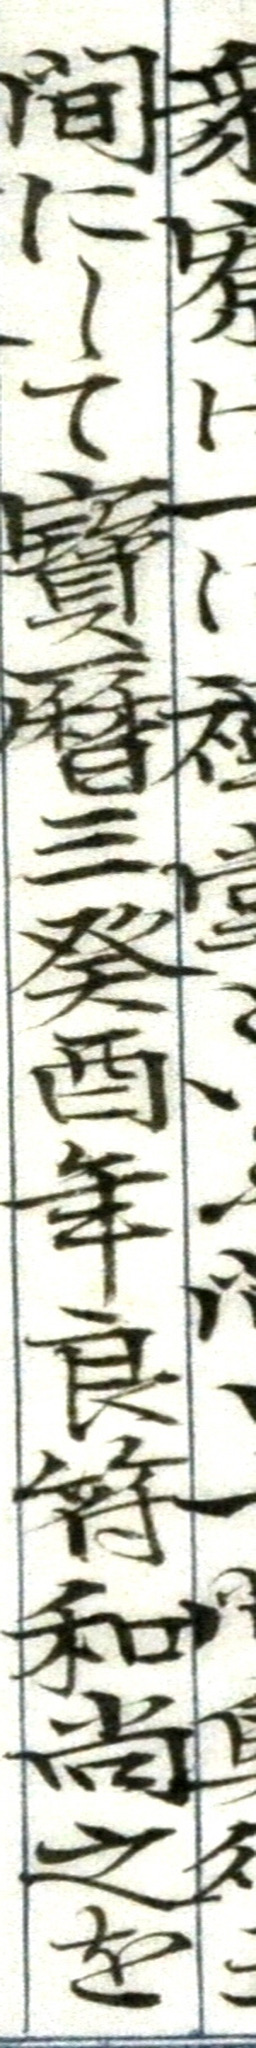間にして宝暦三癸酉年良符和尚之を
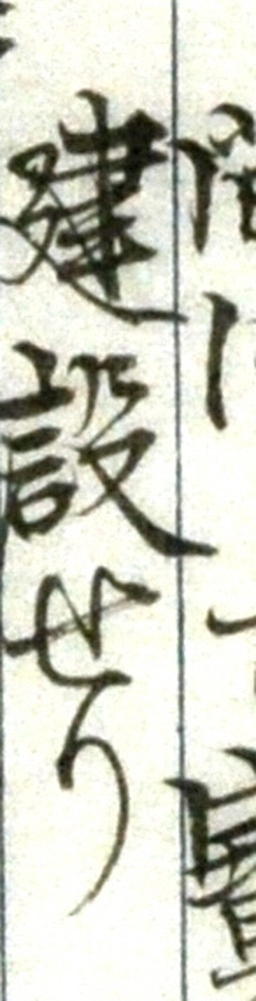建設せり
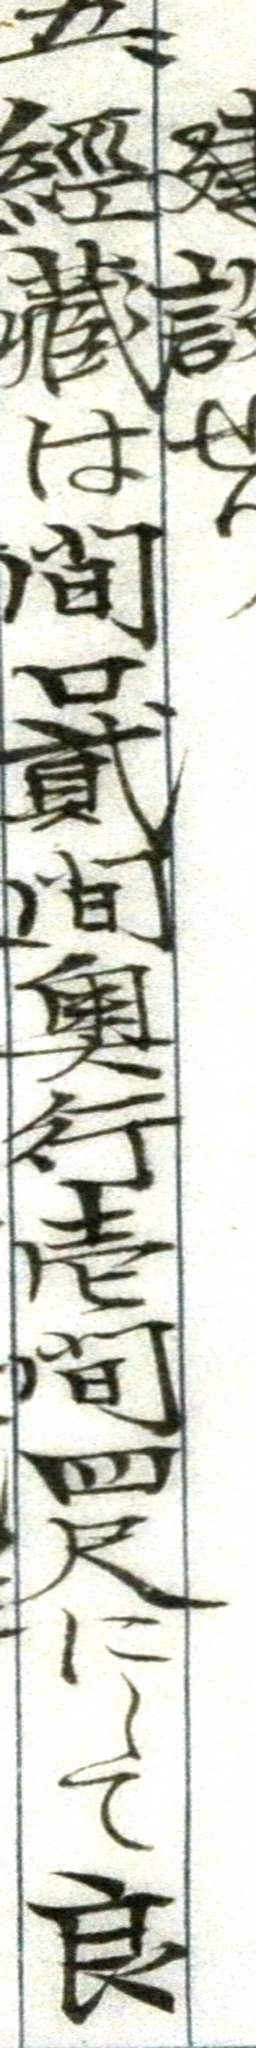五、経蔵は間口弐間奥行壱間四尺にして良
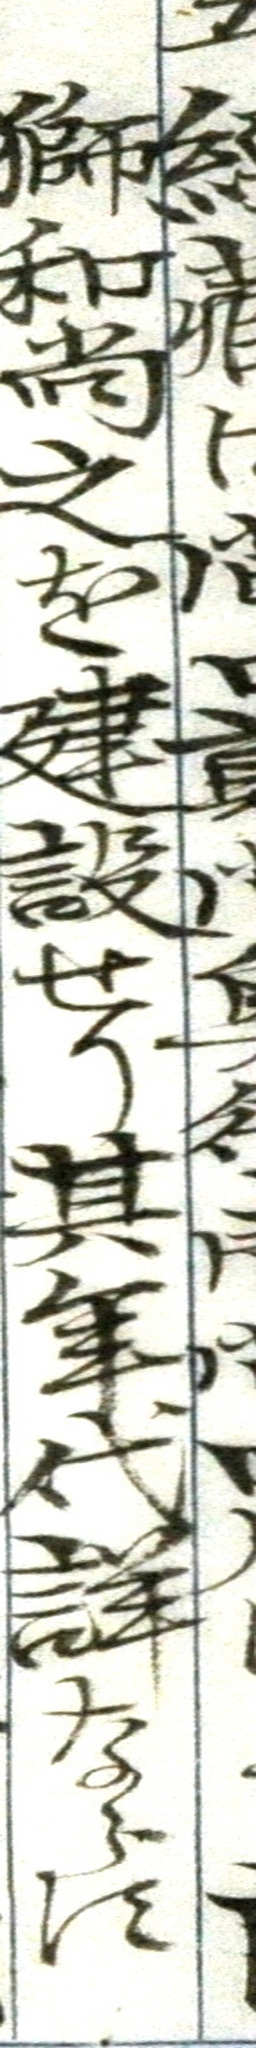獅和尚之を建設せり其年代詳ならす
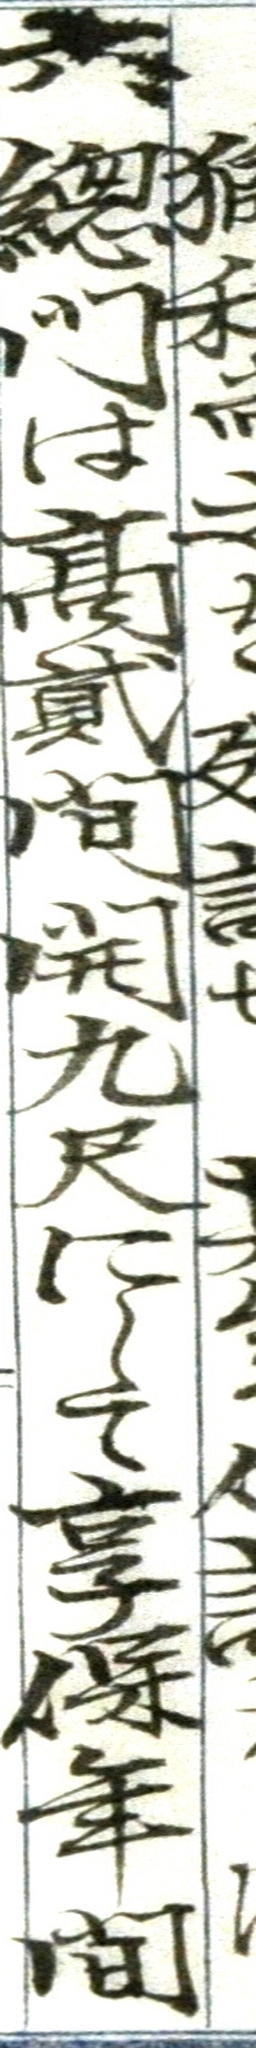六、総門は高弐間開九尺にして享保年間

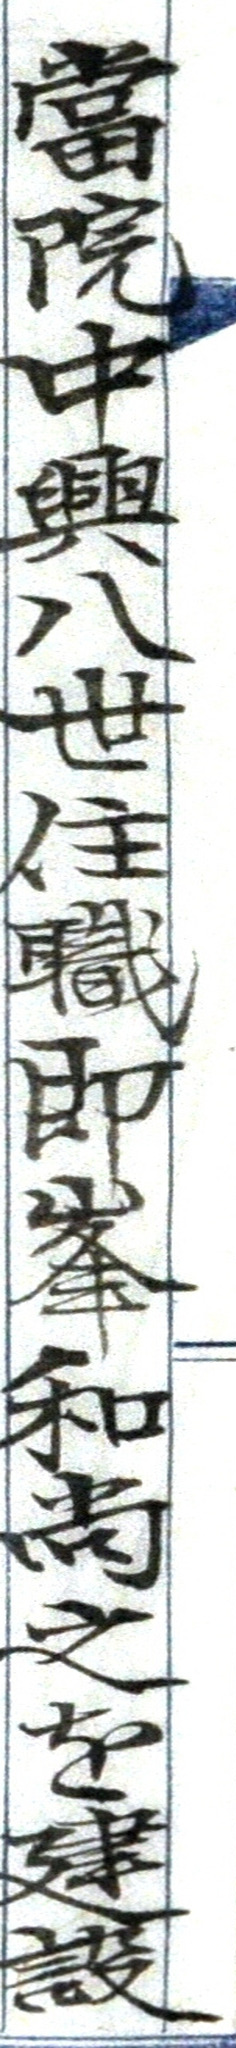当院中興八世住職即峯和尚之を建設
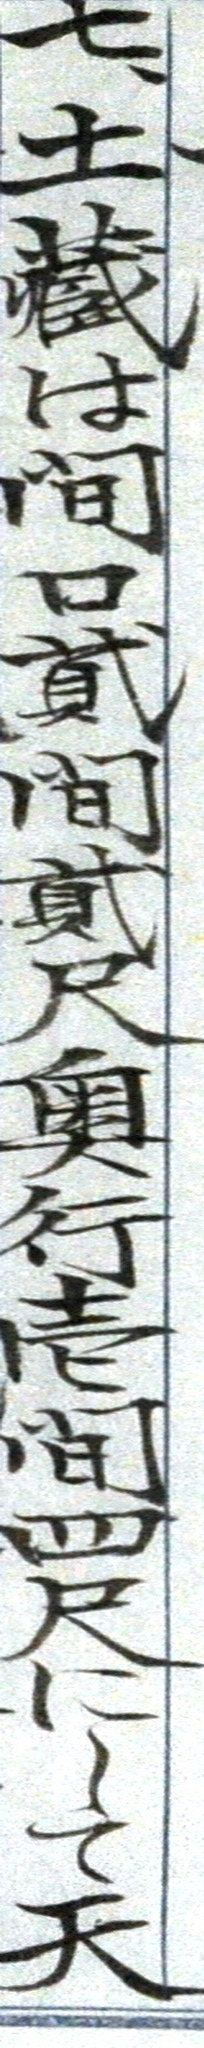七、土蔵は間口弐間弐尺奥行壱間四尺にして天
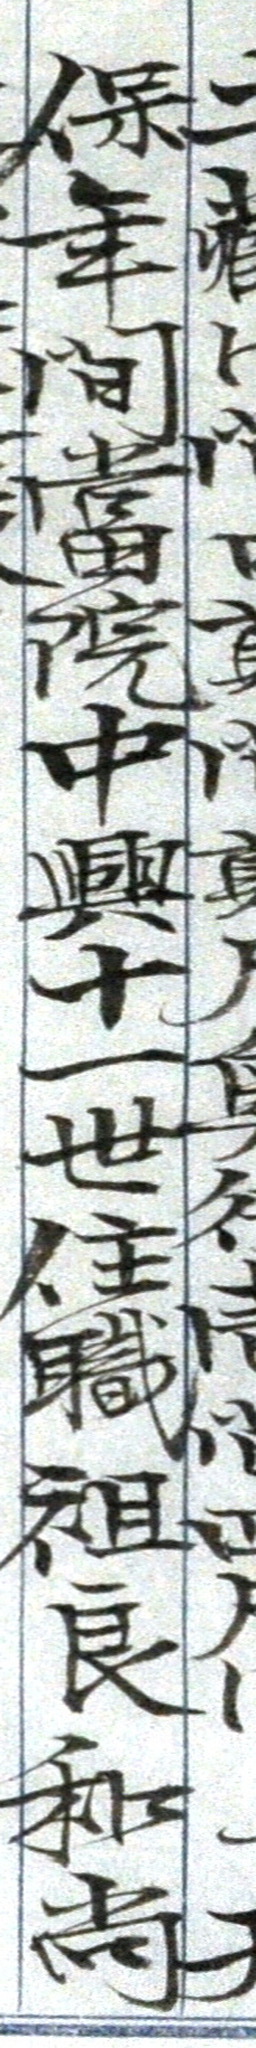保年間当院中興十一世住職祖良和尚
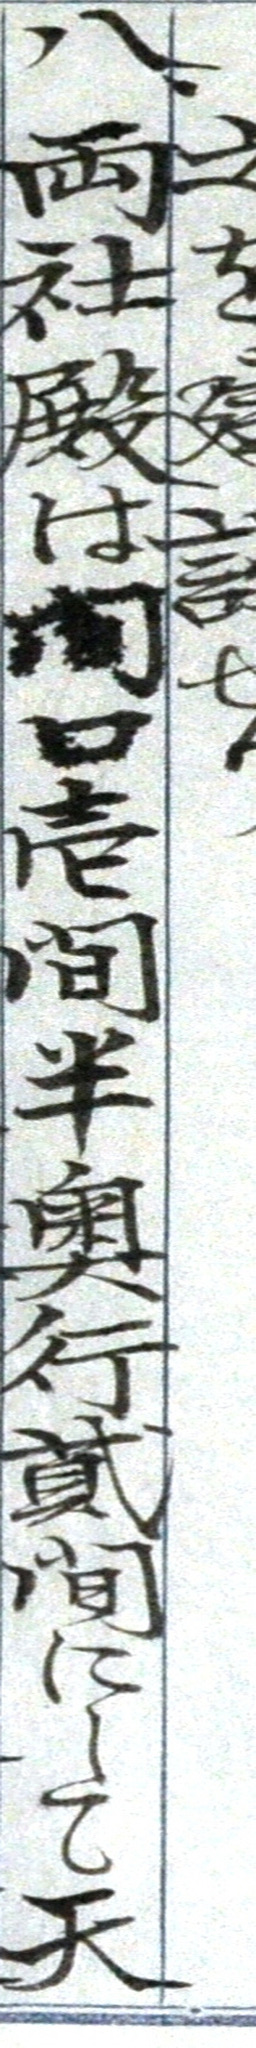八、両社殿は間口壱間半奥行弐間にして天
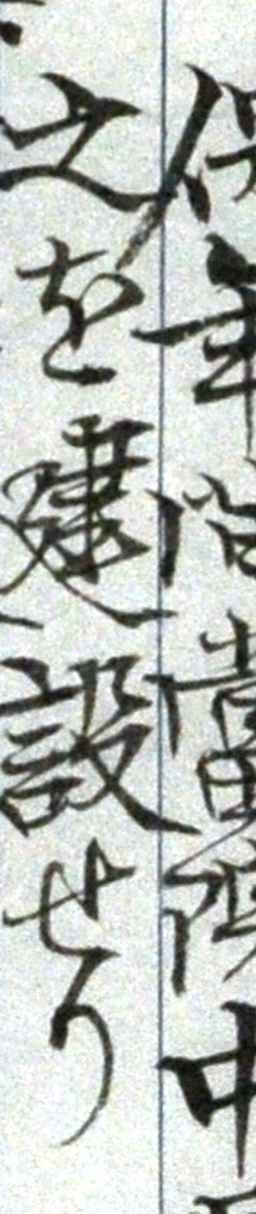之を建設せり
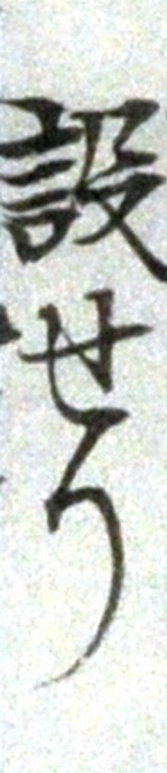設せり
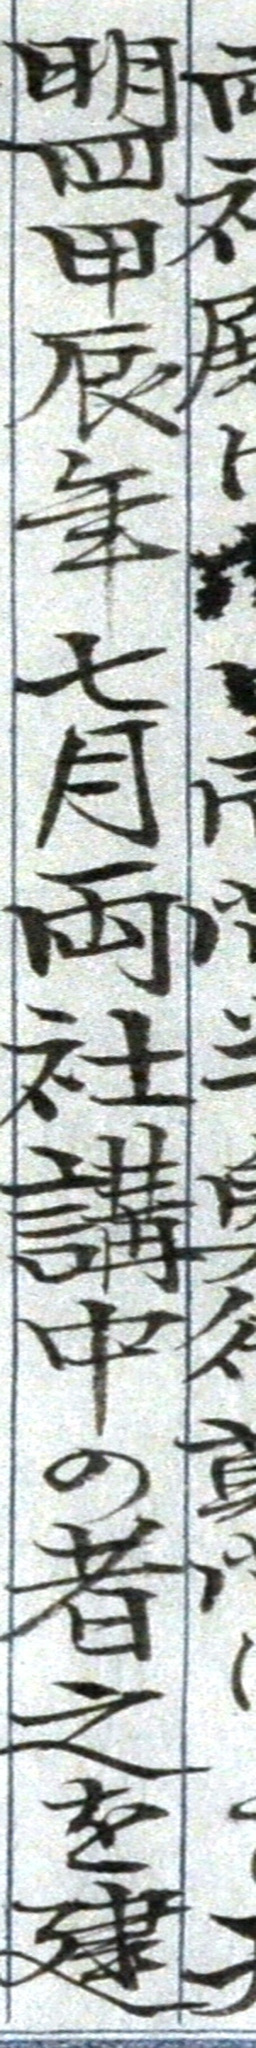明四甲辰年七月両社講中の者之を建
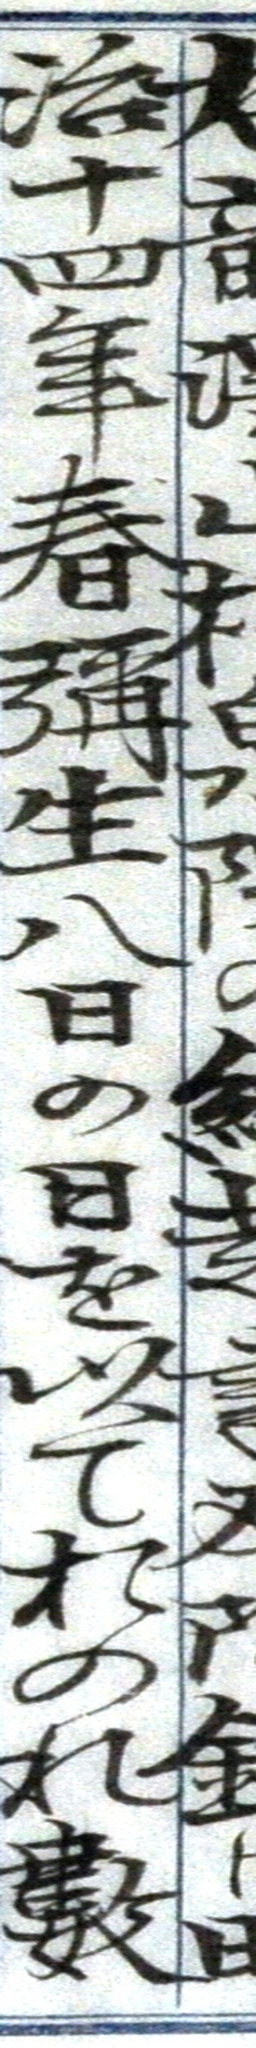治十四年春弥生八日の日を以ておのれ数
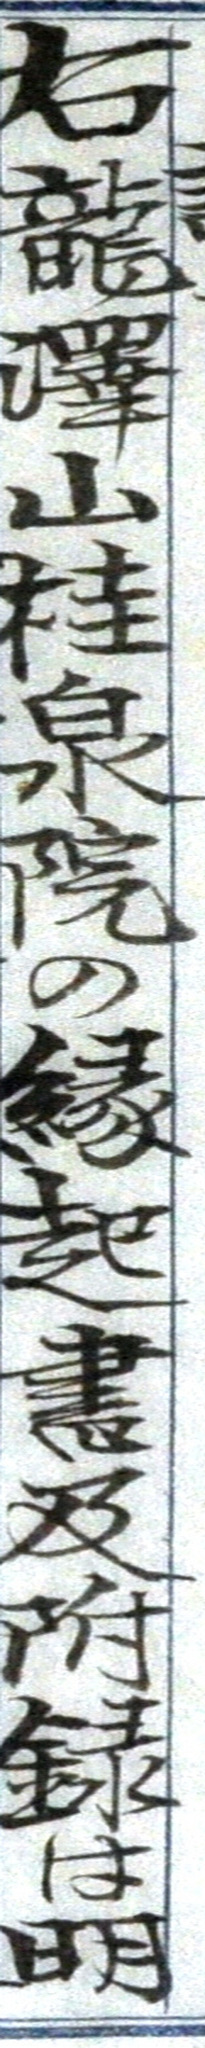右龍澤山桂泉院の縁起書及附録は明
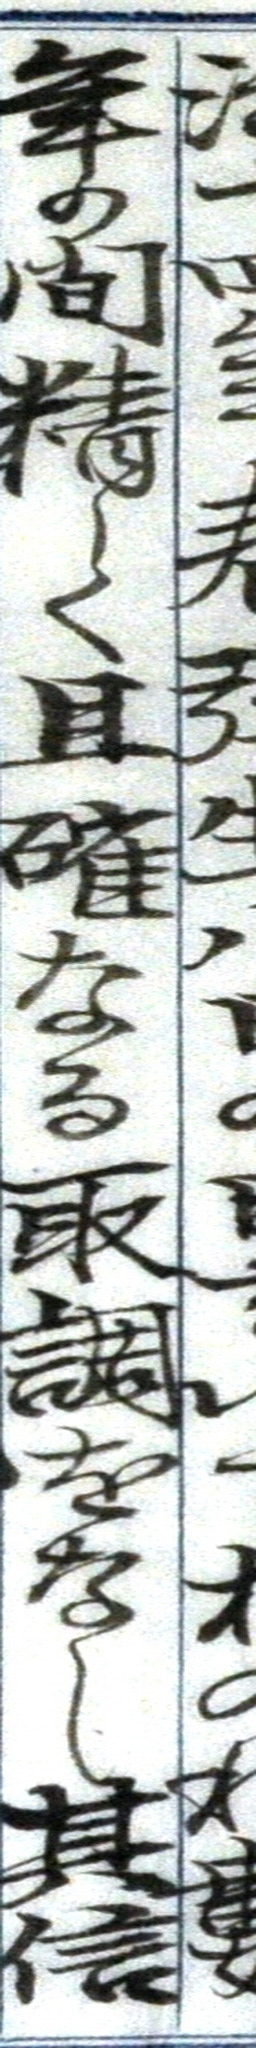年の間精しく且確なる取調をなし其信
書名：桂泉院・樹林寺・東光寺縁起書、蓮華寺由来書、付夕顔観音記
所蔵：伊那市立高遠町図書館・合同会社AMANE
